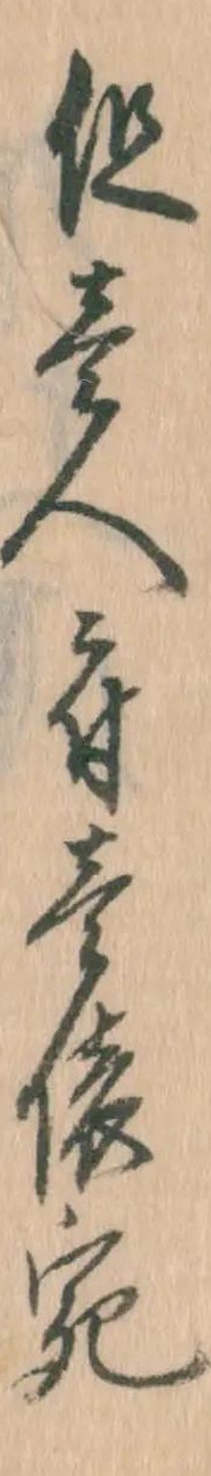但壱人ニ付壱俵宛
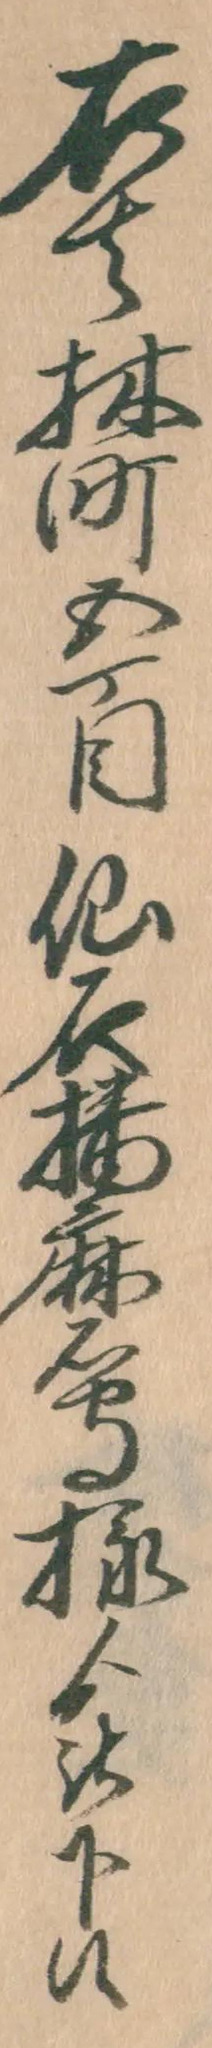右は林町五丁目仙石播磨守様ゟ被下候

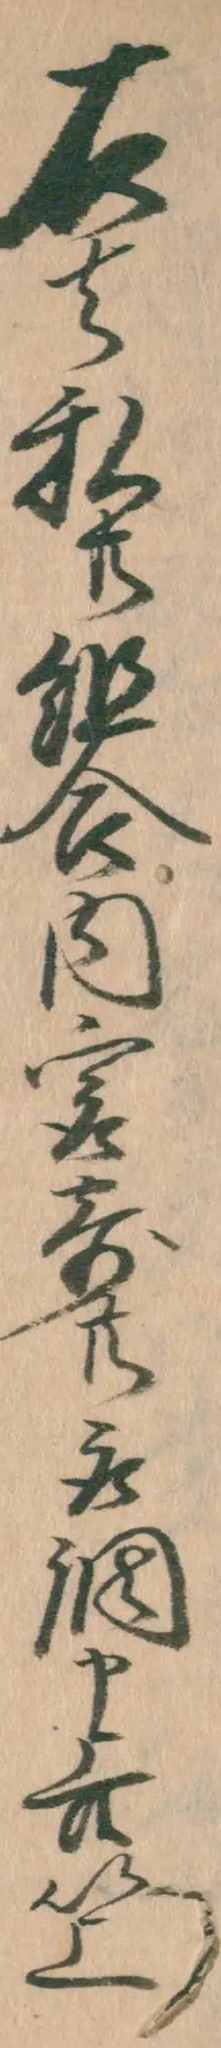右は私共組合内最寄共取調申上候以上
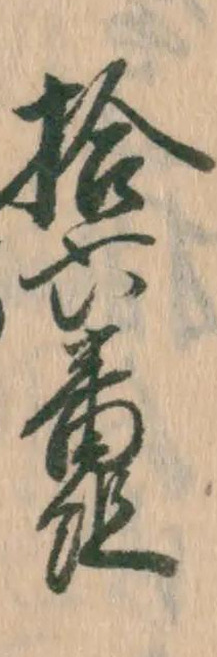拾六番組
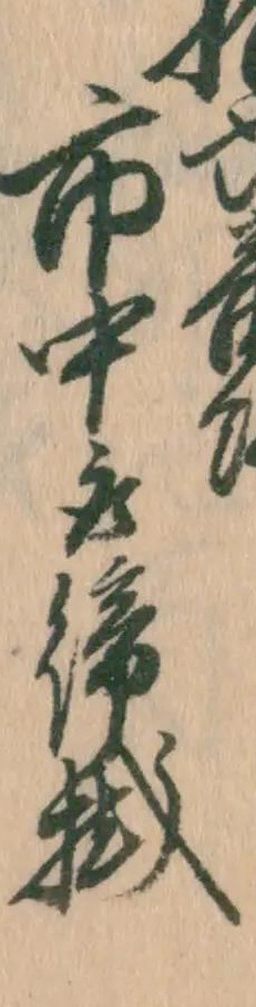市中取締掛
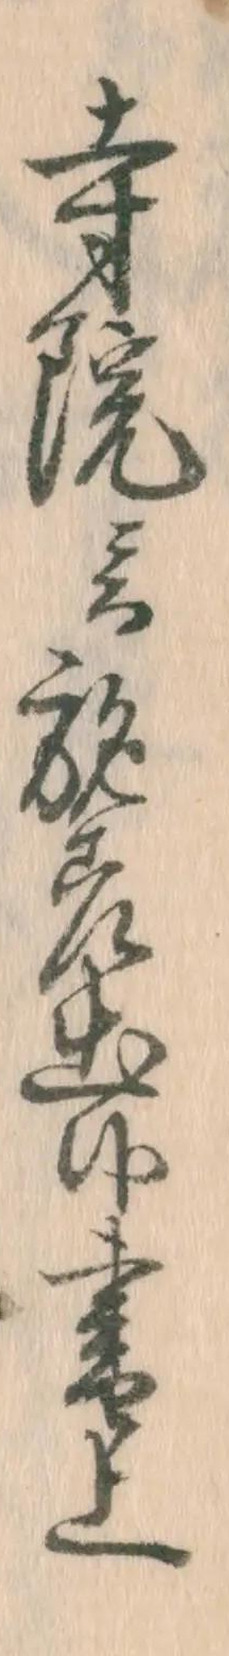寺院ニ而施差出候書上
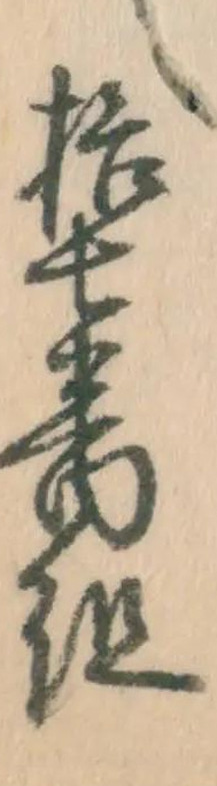拾七番組

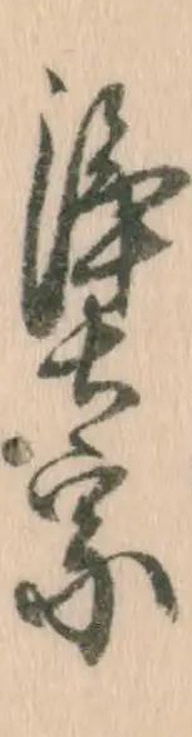浄土宗
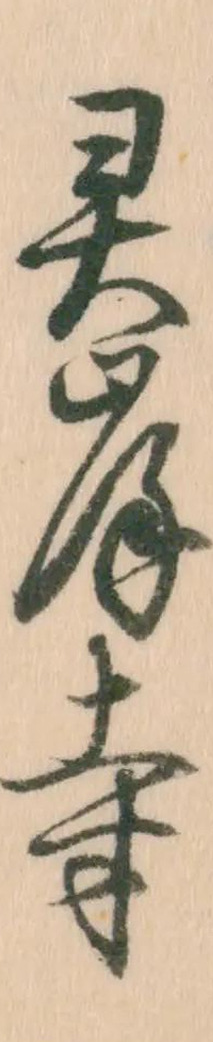霊岸寺
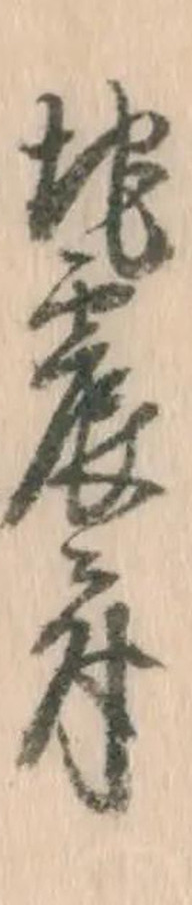地震ニ付
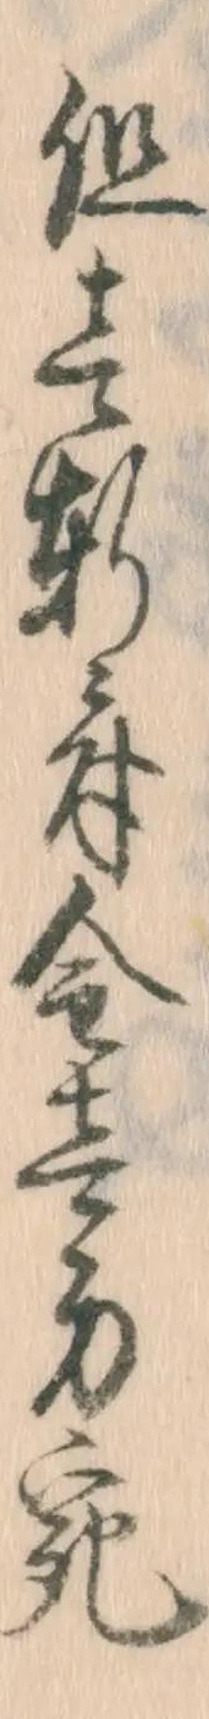但壱軒ニ付金壱分宛
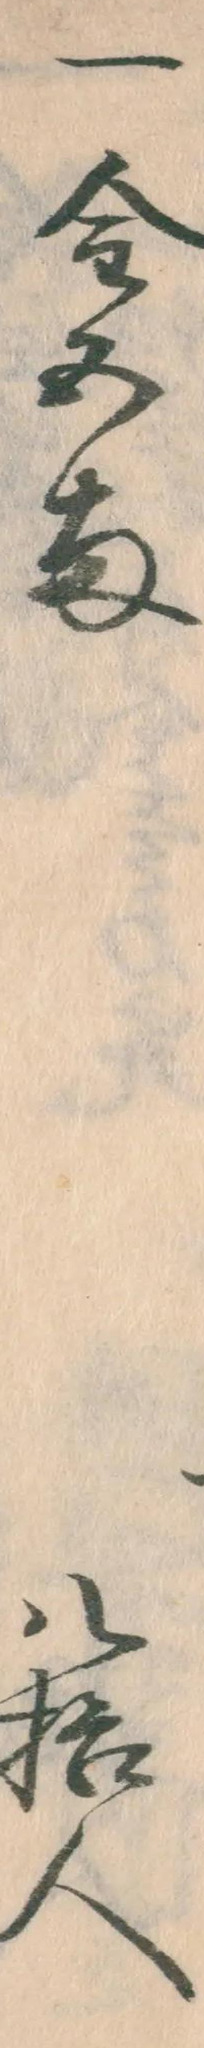一金五両八拾人
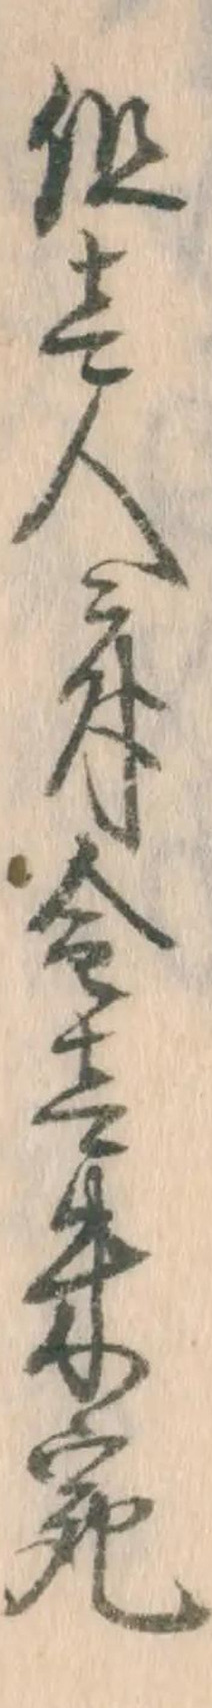但壱人ニ付金壱朱宛

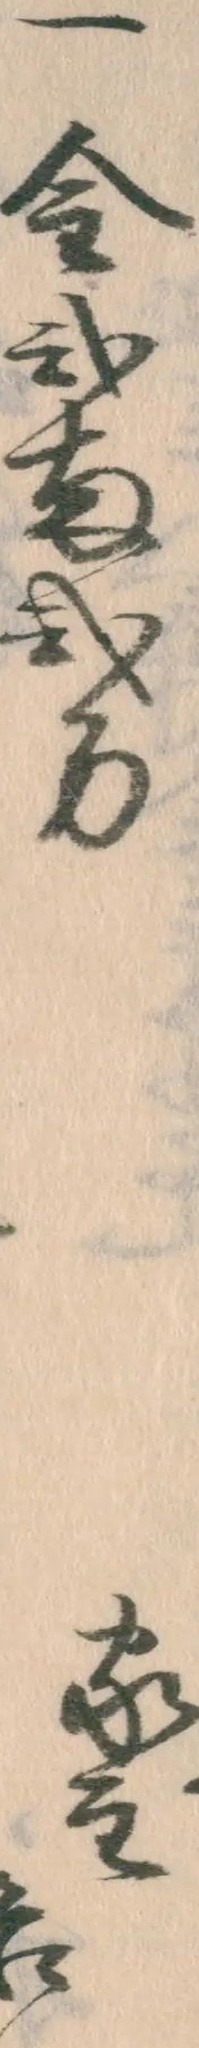一金弐両弐分家主
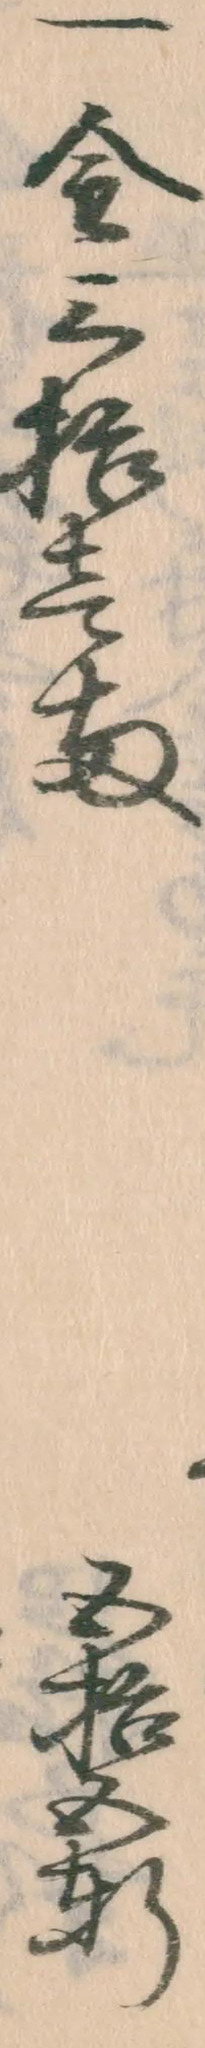一金三拾壱両五拾五軒
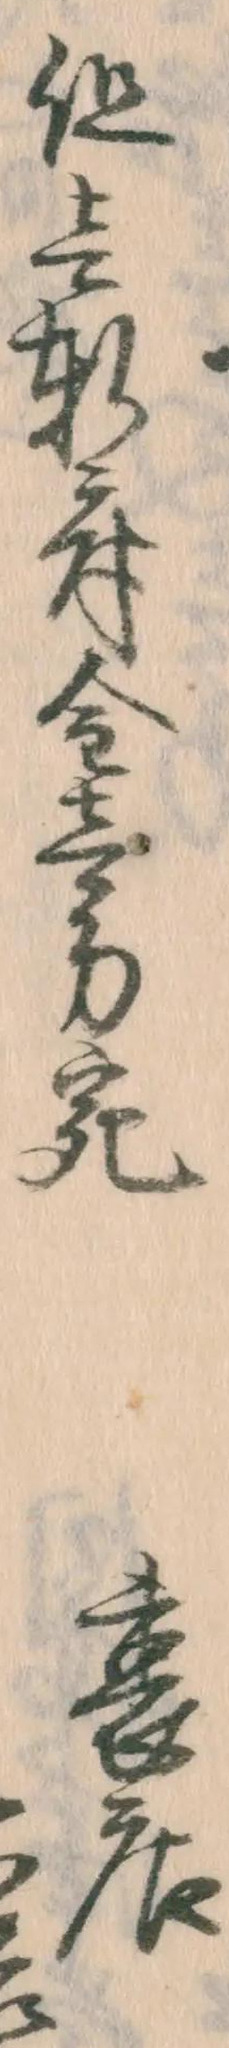但壱軒ニ付金壱分宛裏店
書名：武家方并寺院等ニテ施差出候一件
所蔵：国立国会図書館 National Diet Library, JAPAN
